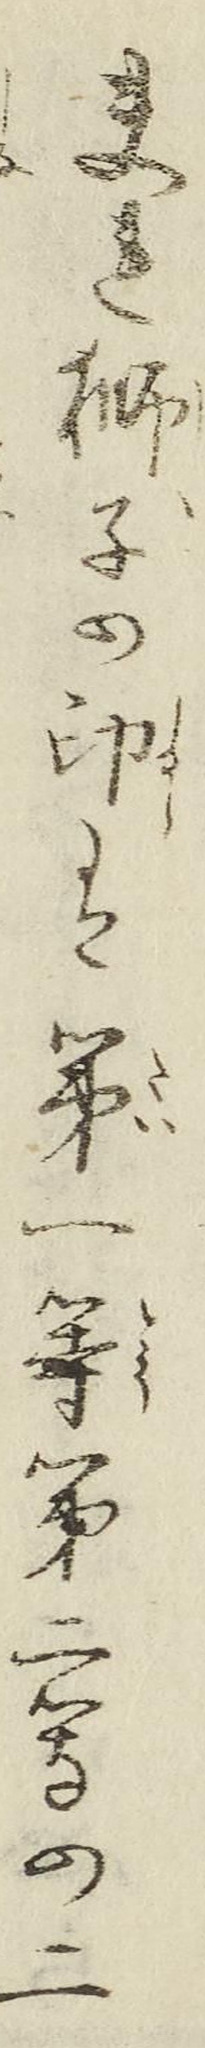夫れ獅子の印は第一等第二等の二
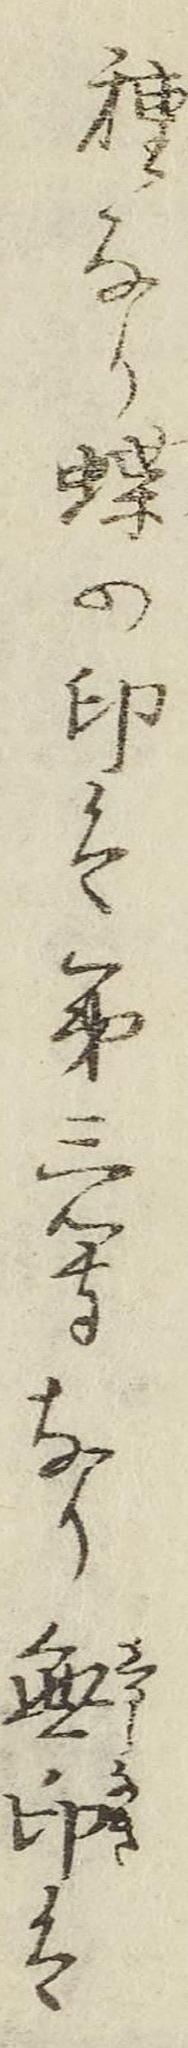種なり蝶の印は第三等なり無印は
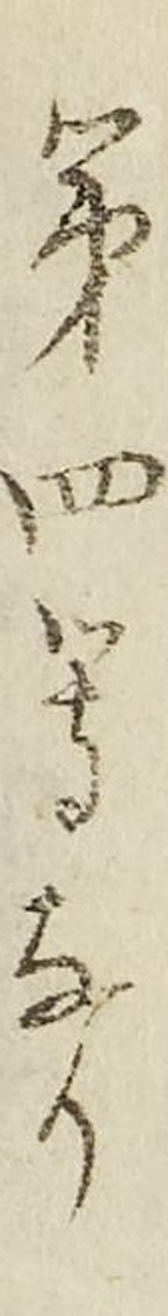第四等なり

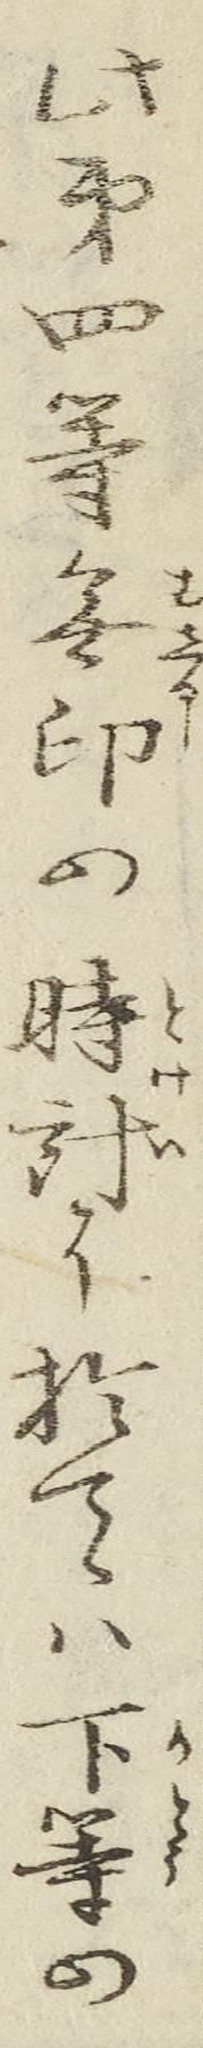此第四等無印の時計に於ては下等の
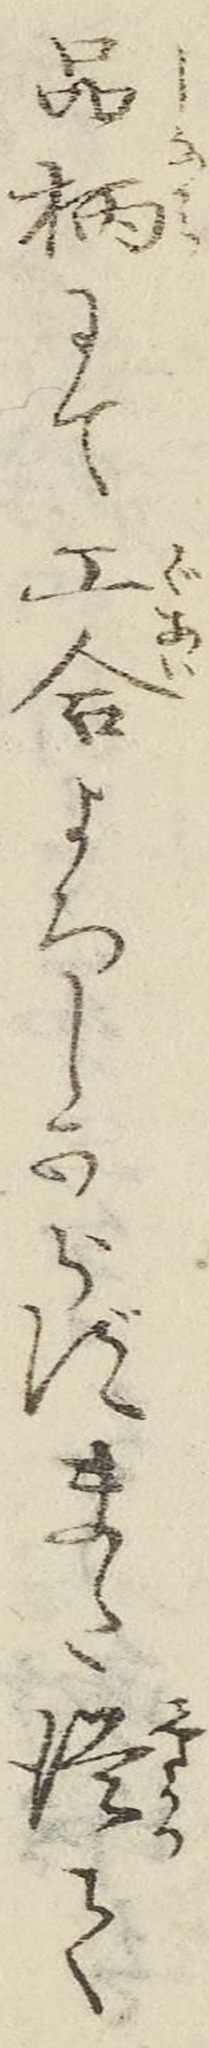品柄にて工合よろしからずまた従て
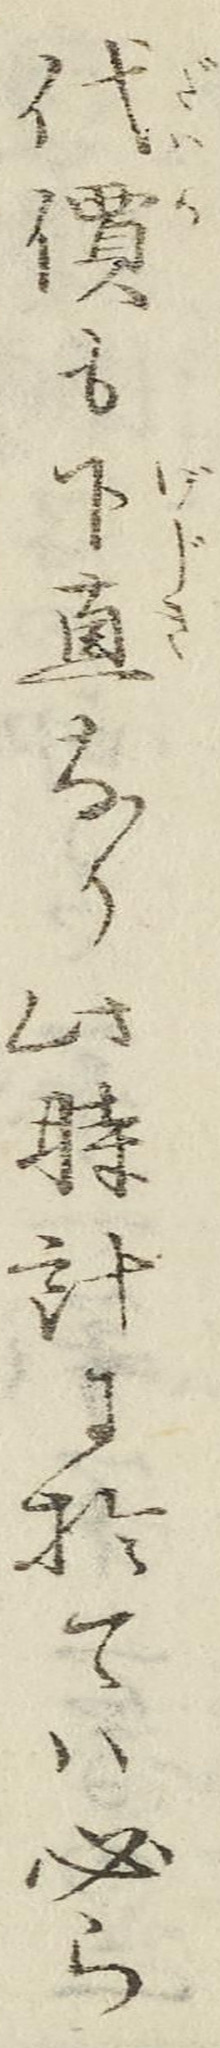代価も下直なり此時計に於ては必ら
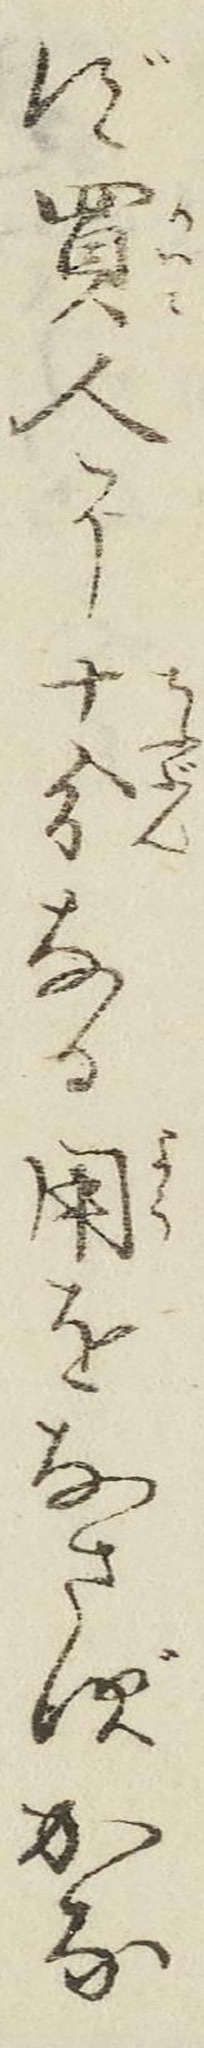ず買人に十分なる用をなさずかな
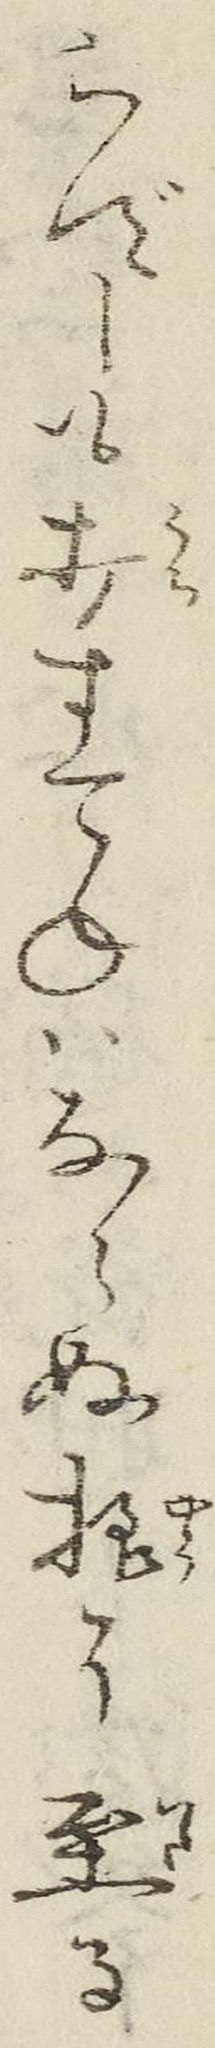らずしも打すてねはならぬ様に至る
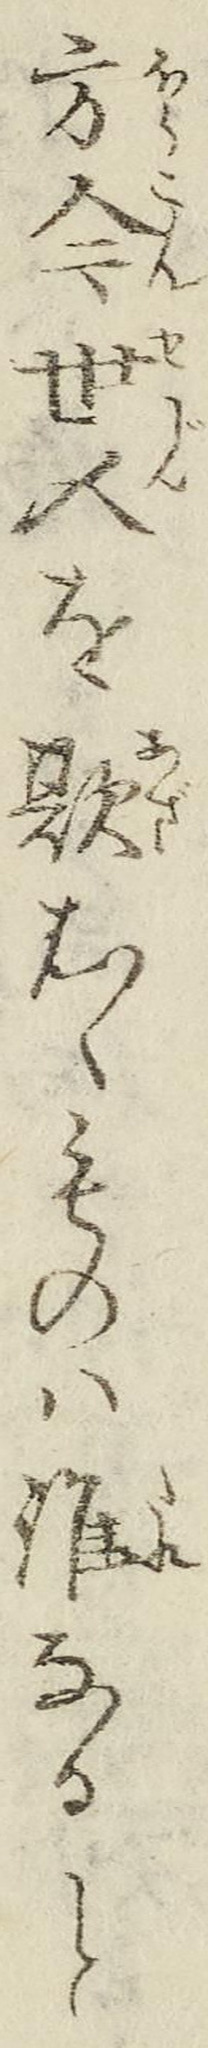方今世人を欺むくものは惟なると
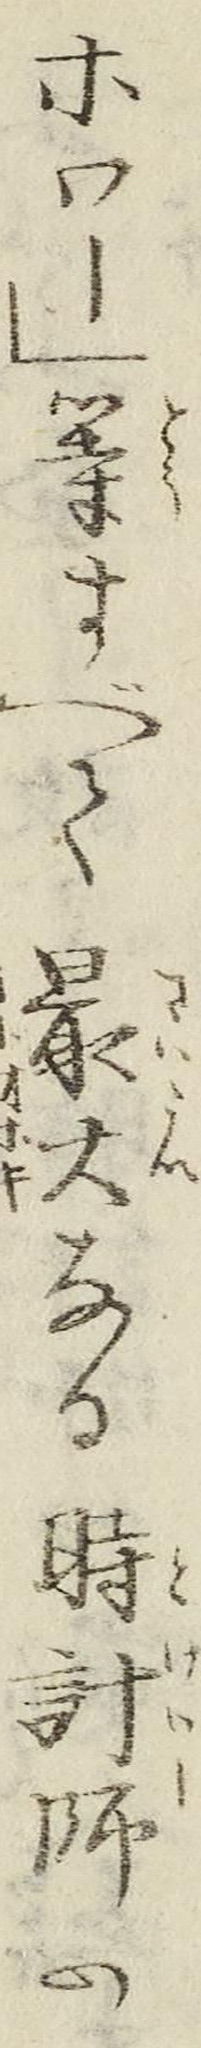ホワー」等すべて最大なる時計師の
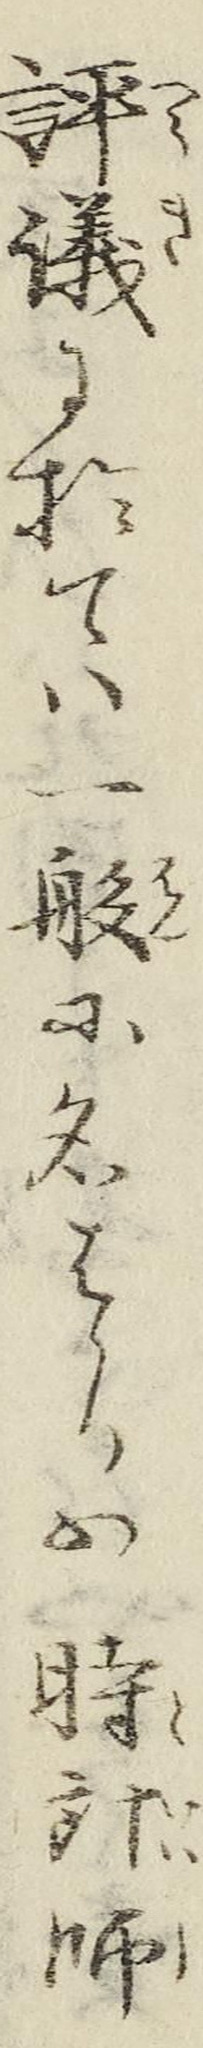評議に於ては一般に名はかりの時計師
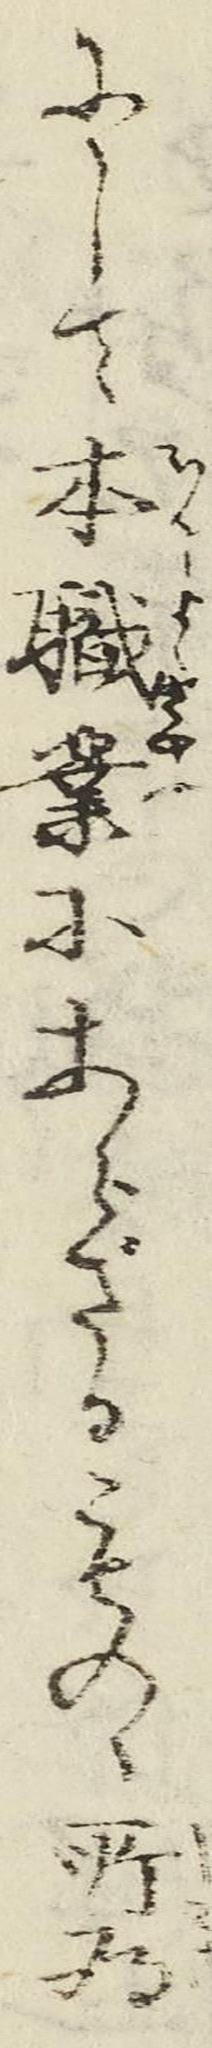にして本職業にあらざるものゝ所為
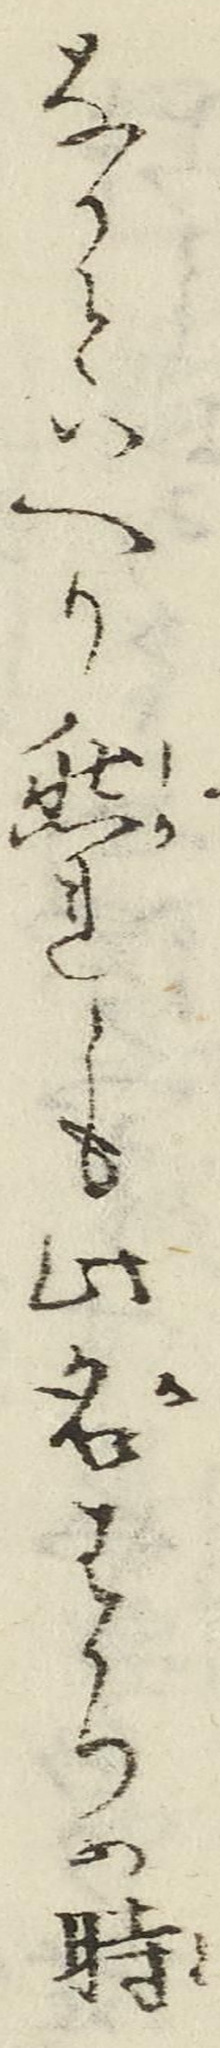なりといへり然れとも此名はかりの時
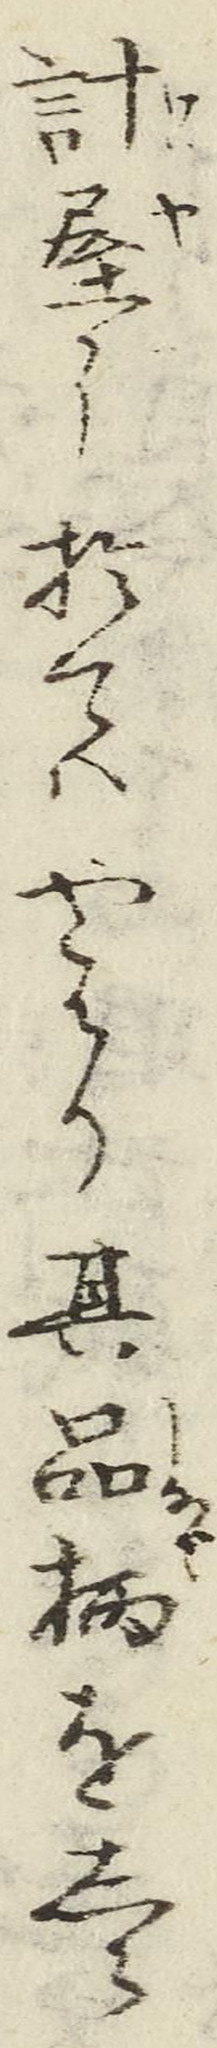計屋に於てはやはり其品柄をしら
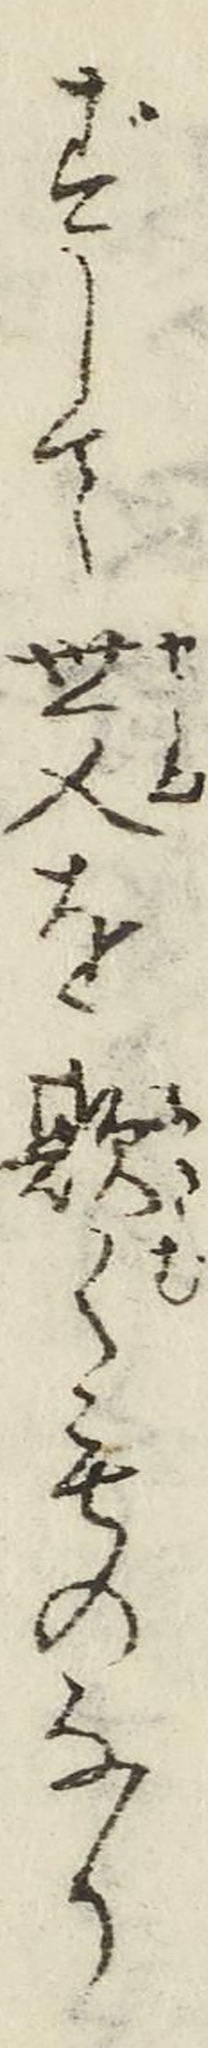ずして世人を欺くものなり
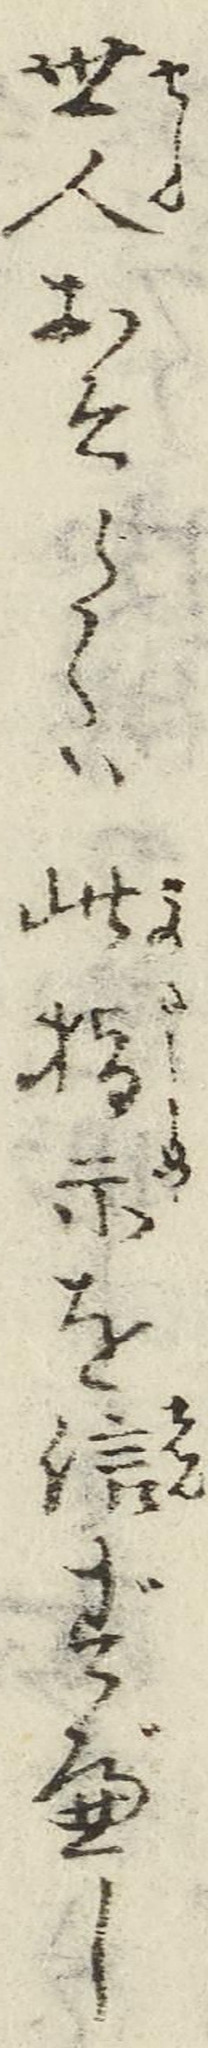世人おそらくは此指示を信ずべし
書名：[時計に関する冊子]
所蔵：東京大学地震研究所図書室 Earthquake Research Institute Library, The University of Tokyo, JAPAN
